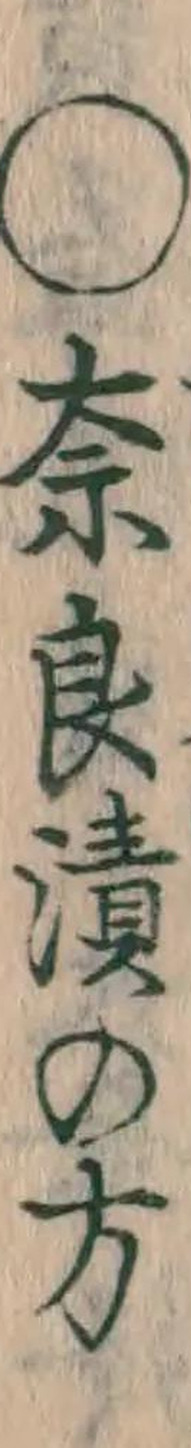○奈良漬の方
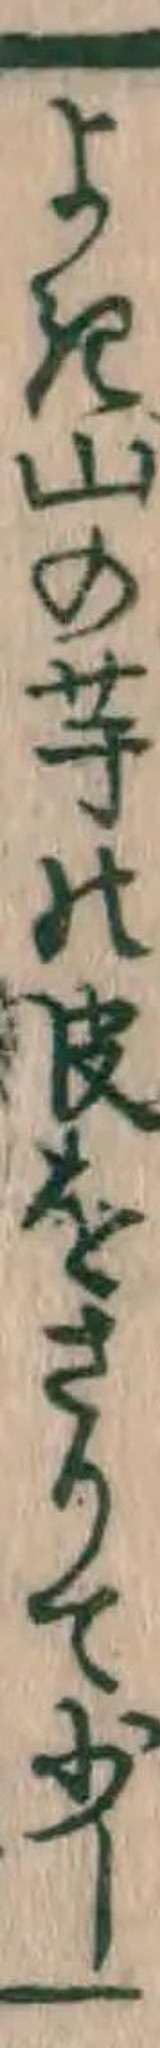よき山の芋の皮をさりて少し
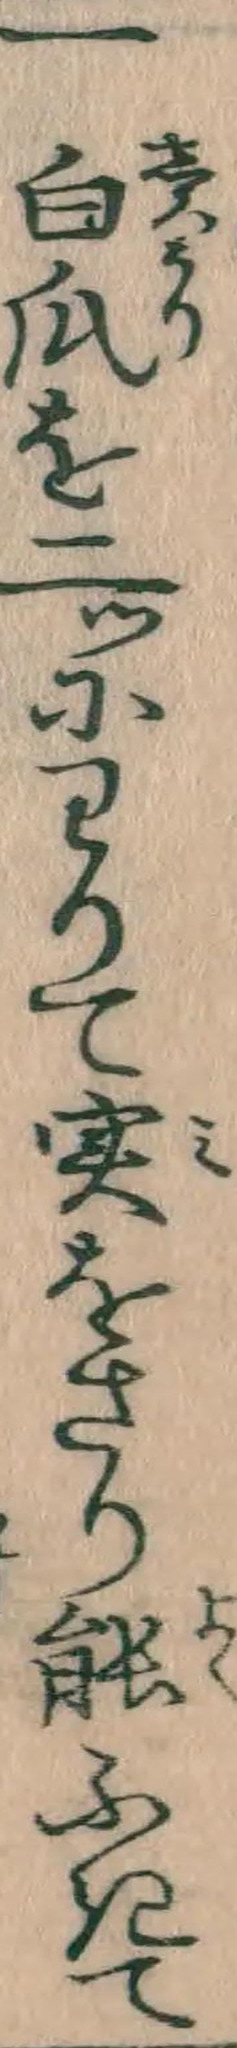一白瓜を二ッにわりて実をさり能ふきて
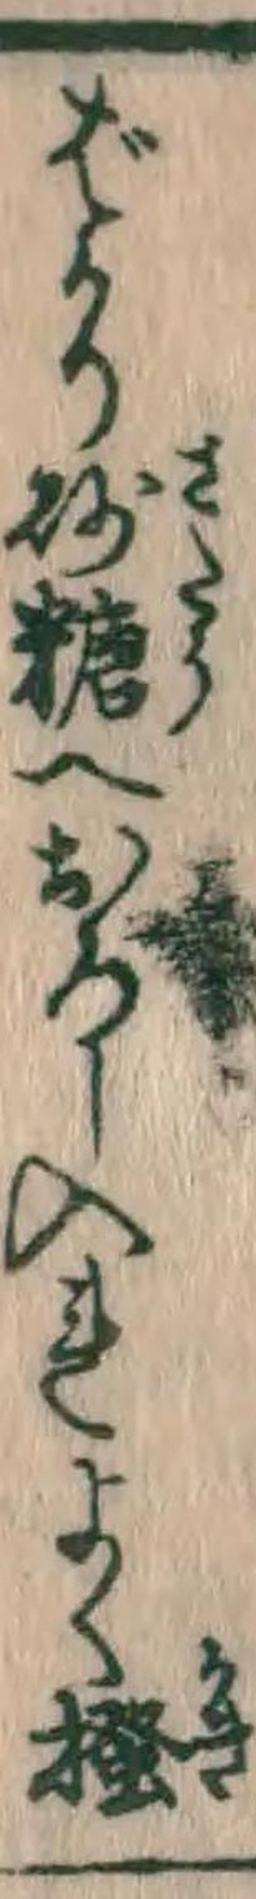ばかり砂糖へおろし入れよく掻
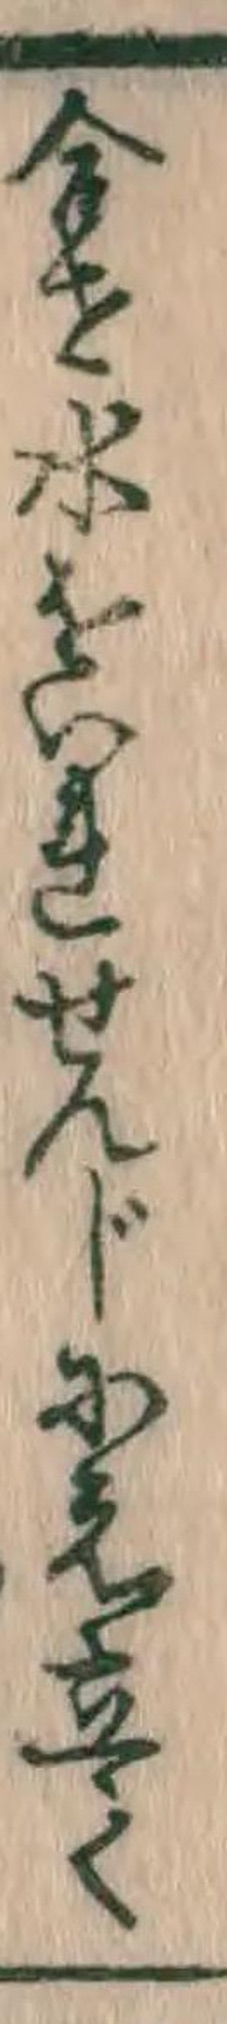合せ水をいれせんじにえ立て
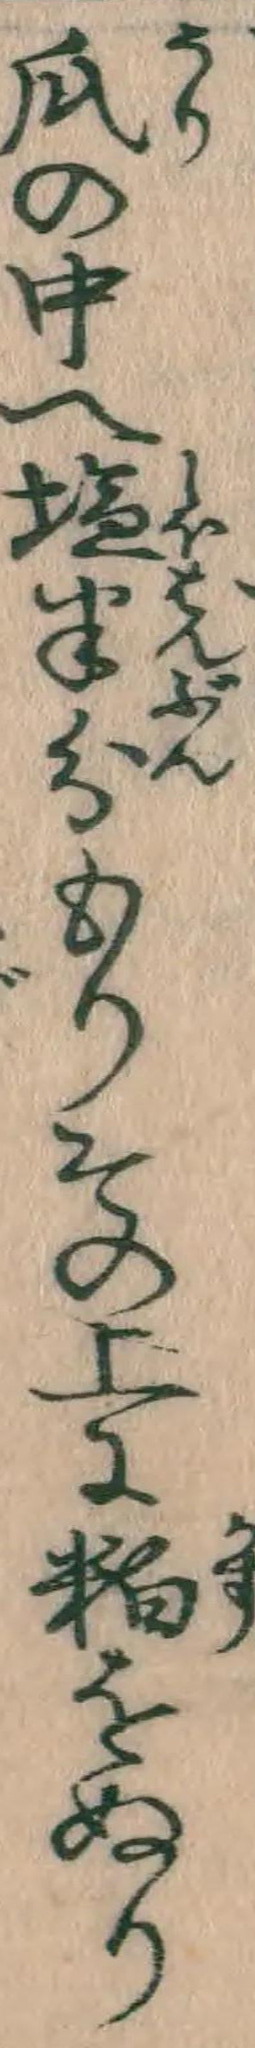瓜の中へ塩半分もりその上に粕をぬり
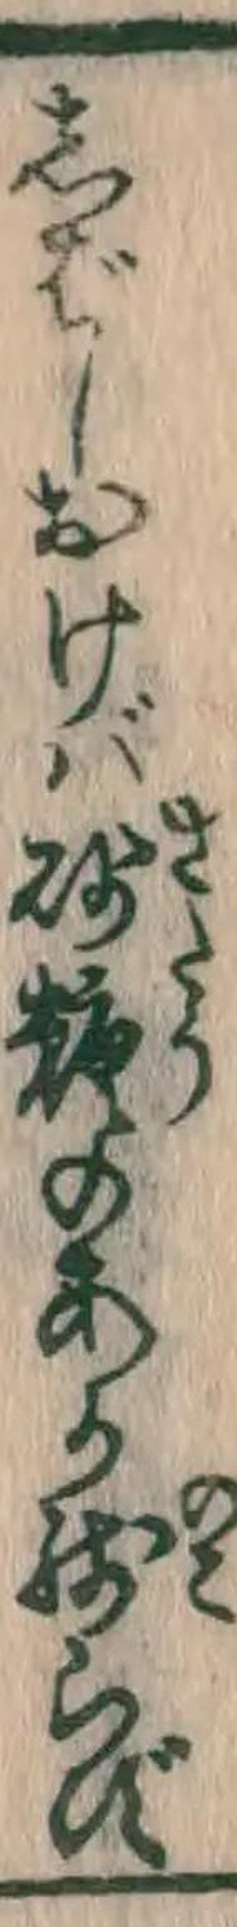しばしおけば砂糖のあか残らず
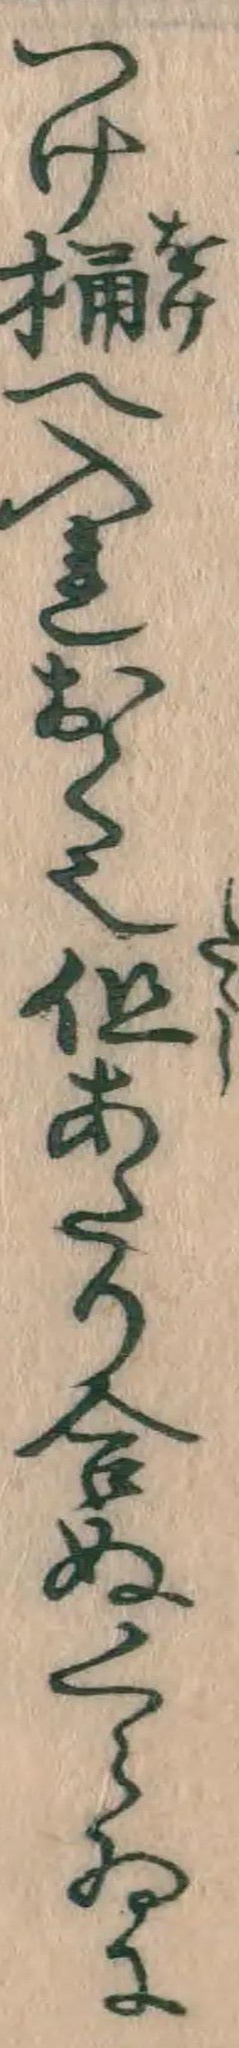つけ桶へ入れおく也但あたり合ぬくらゐに
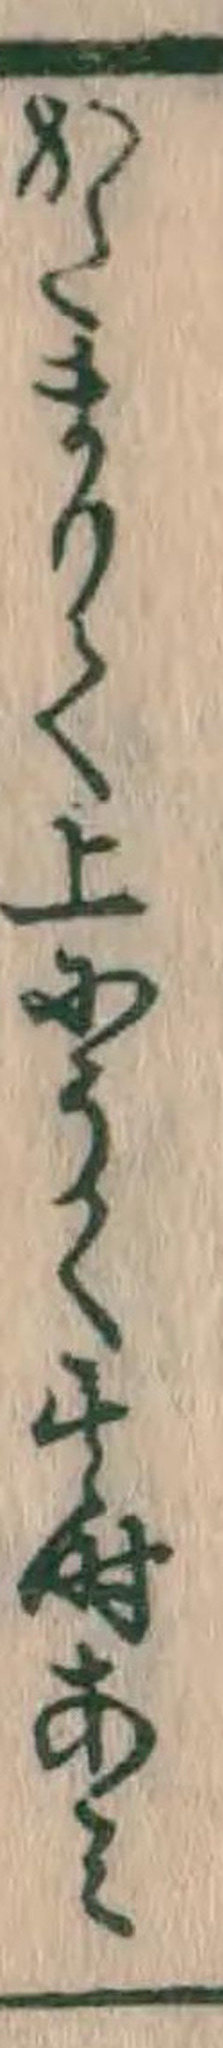かたまりて上にうく其時あみ
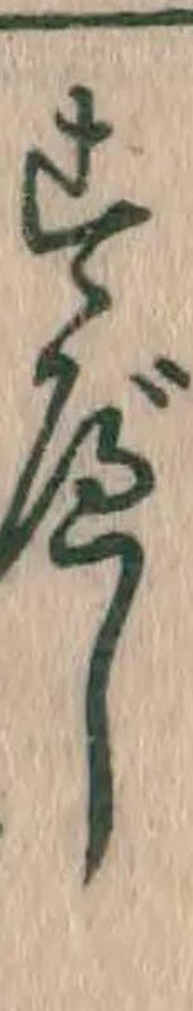すべし
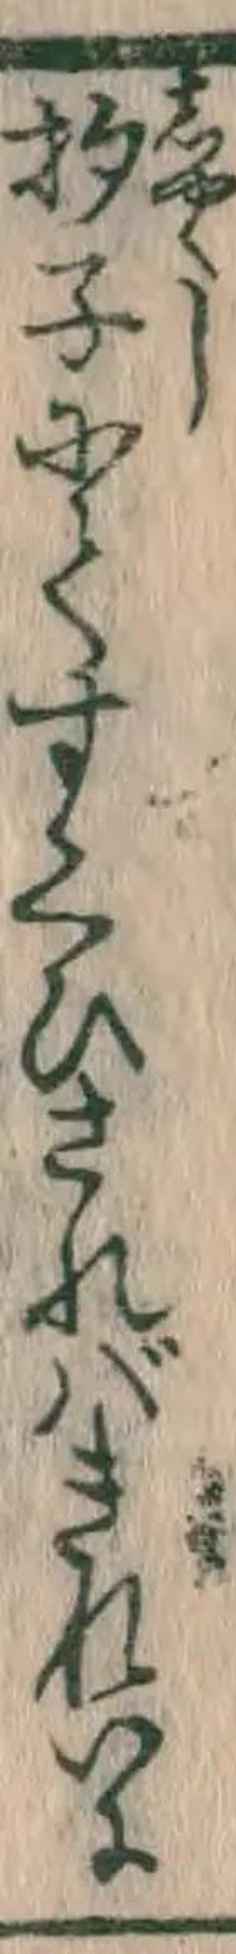杓子にてすくひさればきれいに
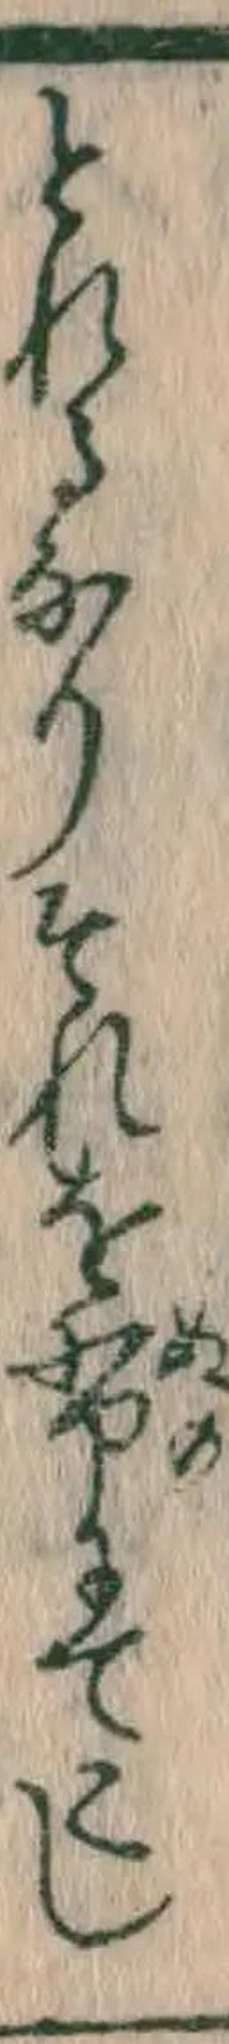とれるなりそれを布にてこし
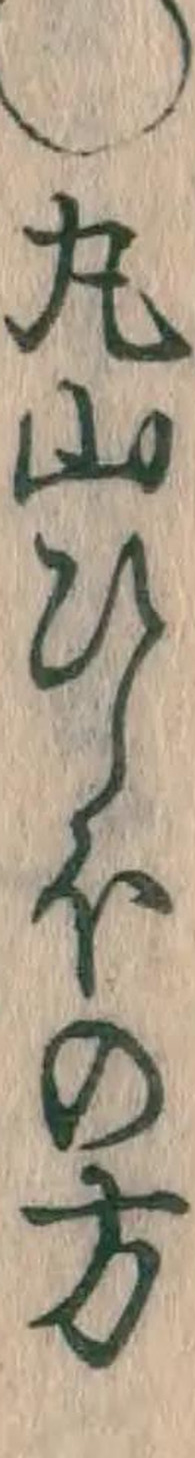○丸山ひしほの方
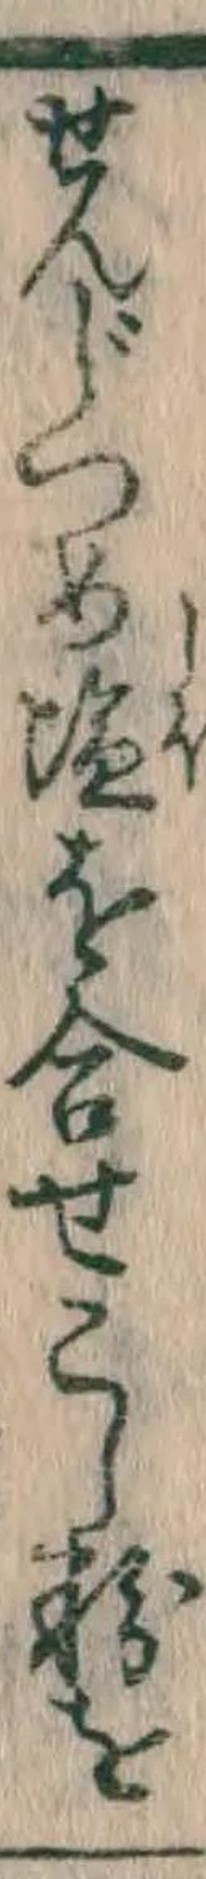せんじつめ塩を合せこし粉を
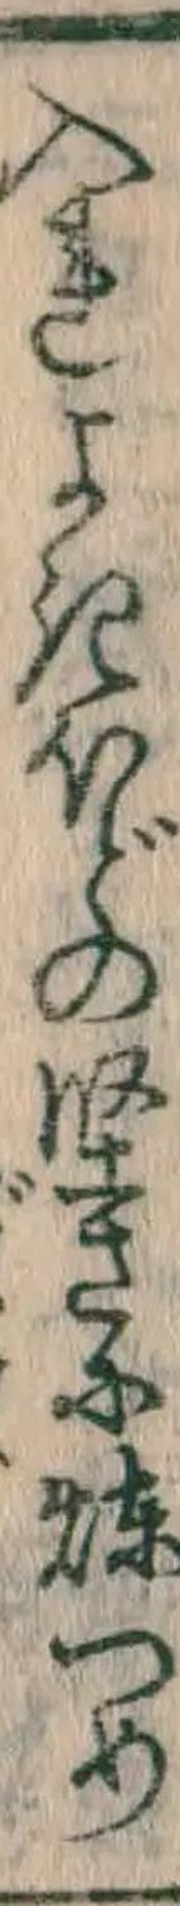入れよきほどの堅さに煉つめ
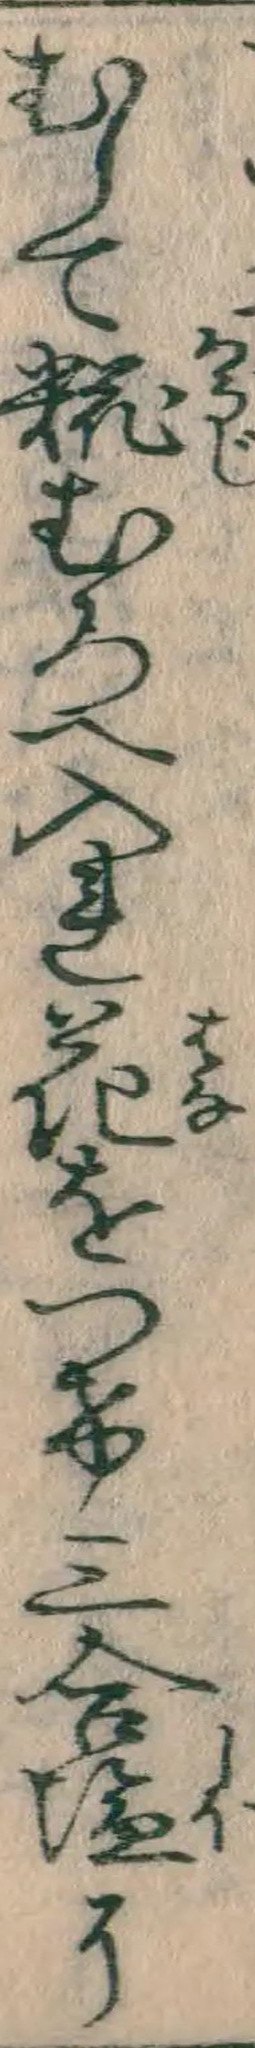むして糀むろへ入れ花をつけ三合塩に
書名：広益秘事大全 3巻. [5]
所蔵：国立国会図書館 National Diet Library, JAPAN
